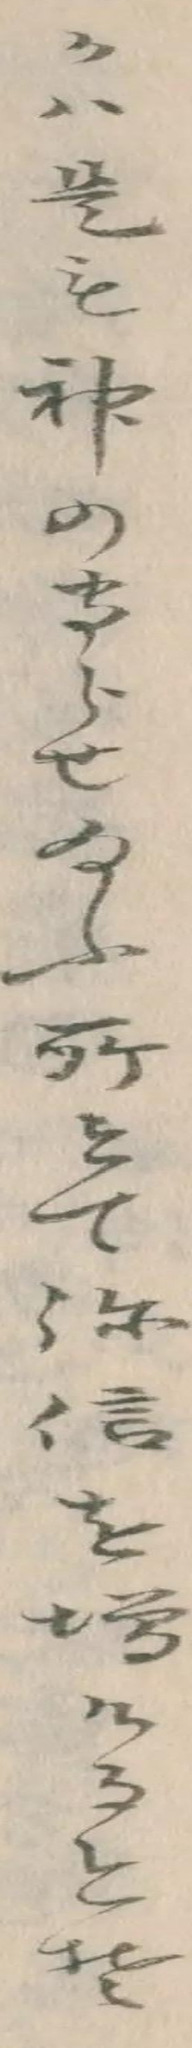かは是を神の守らせ給ふ所とて弥信を増けるとそ

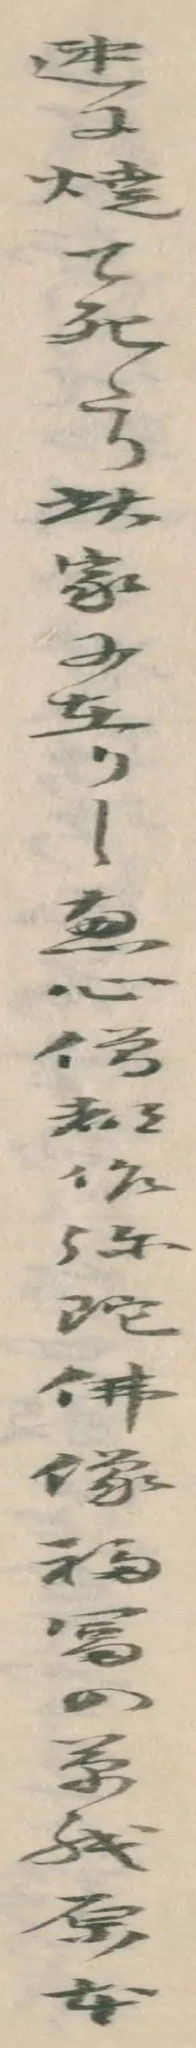速に焼て死たり此家に在りし恵心僧都作弥陀仏像福冨の草紙原本
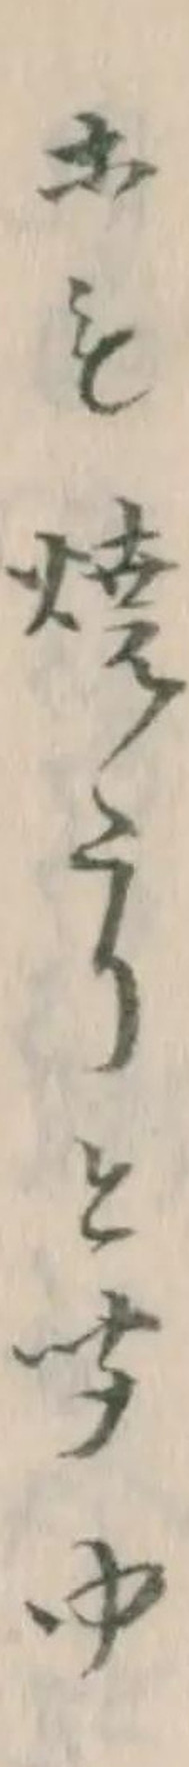等も焼たりと聞ゆ
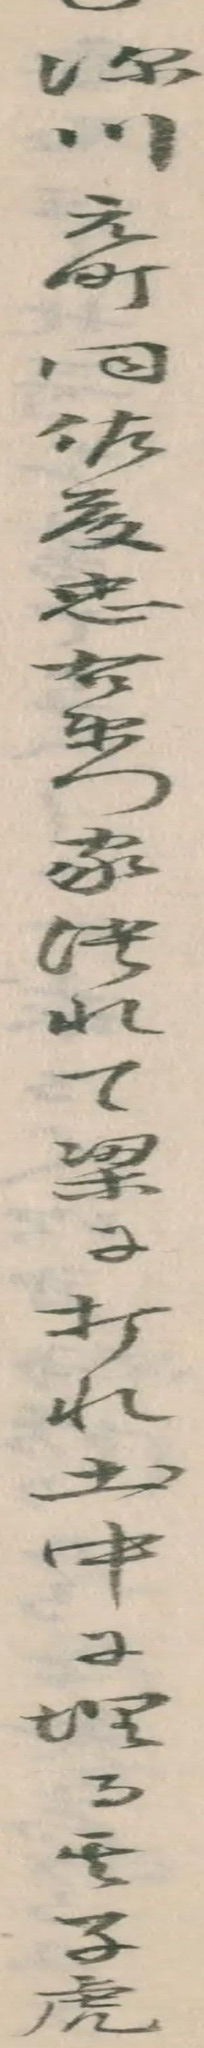〇深川元町同佐藤忠右衛門家潰れて梁に打れ土中に埋る其子虎
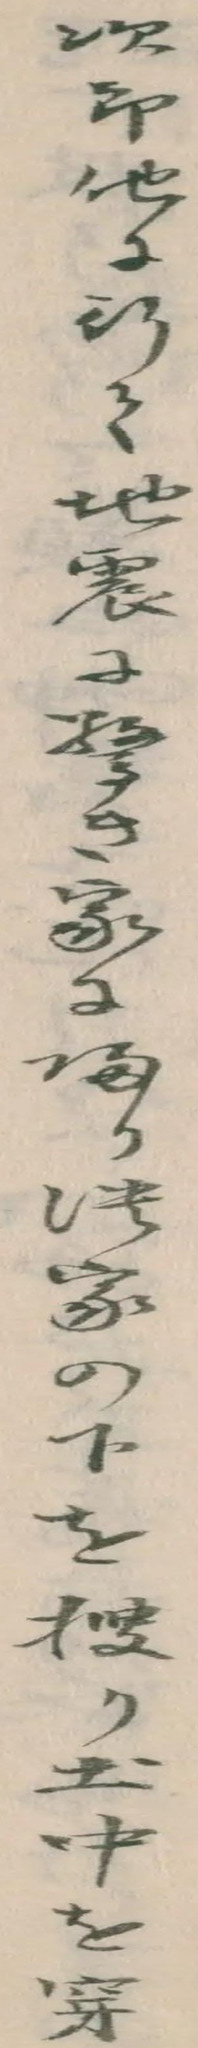次郎他に行て地震に驚き家に帰り潰家の下を捜り土中を穿
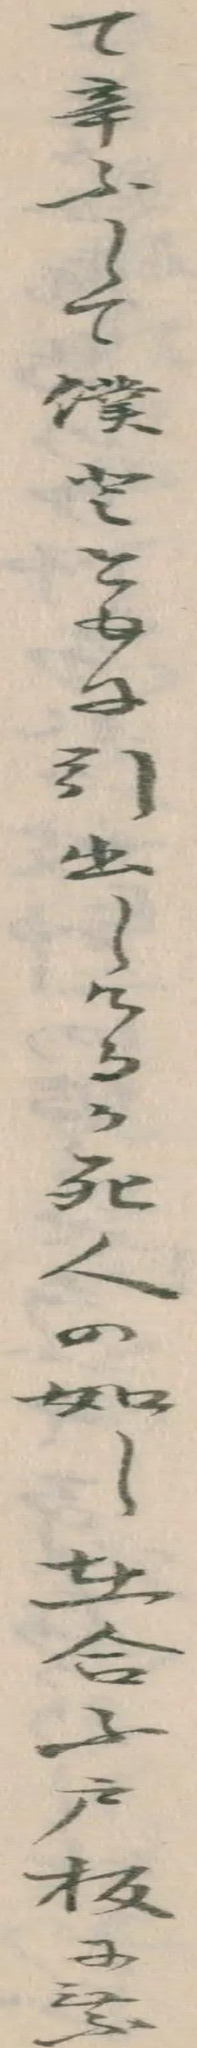て辛ふして僕とともに引出しけるか死人の如し在合ふ戸板に乗
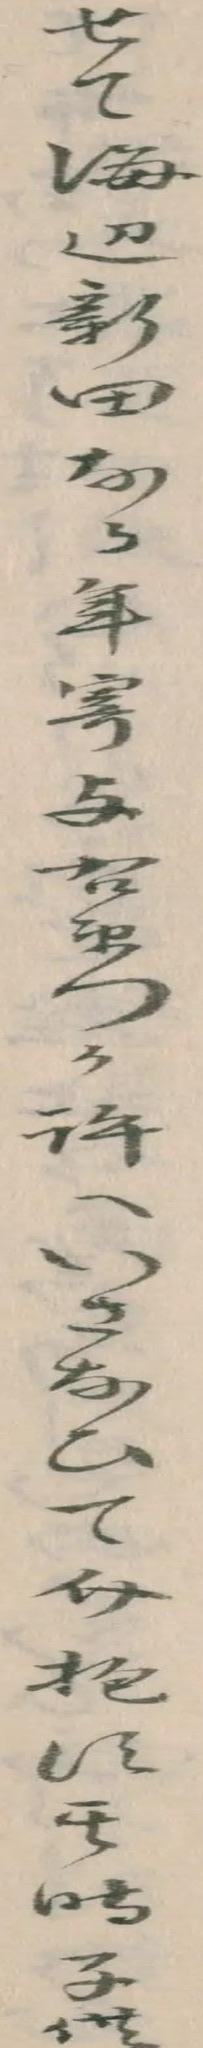せて海辺新田なる年寄与右衛門か許へいさなひて介抱す其時子供
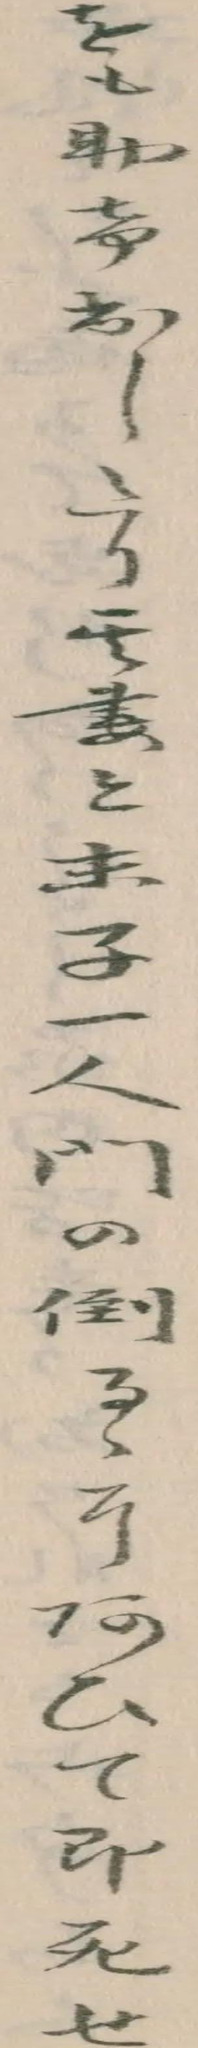をも助け出したり其妻と末子一人門の倒るゝにあひて即死せ
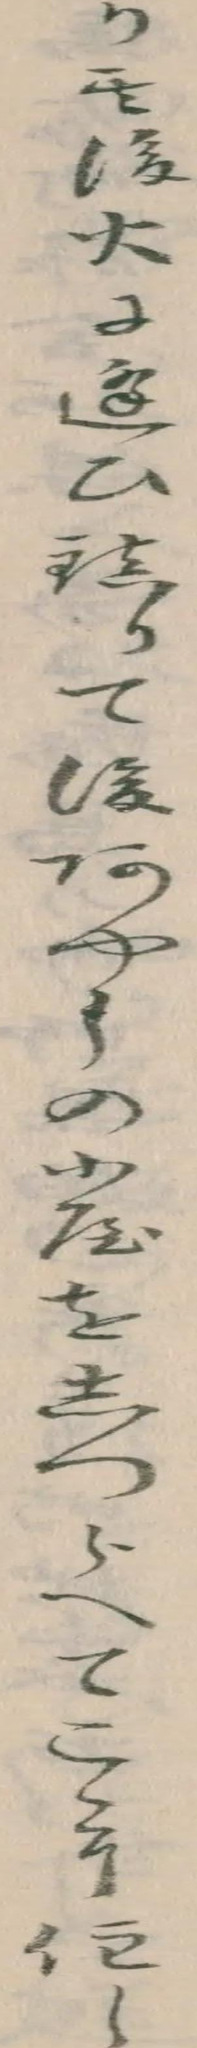り其後火に逢ひ鎮りて後あやしの小屋をしつらへてこゝに住し
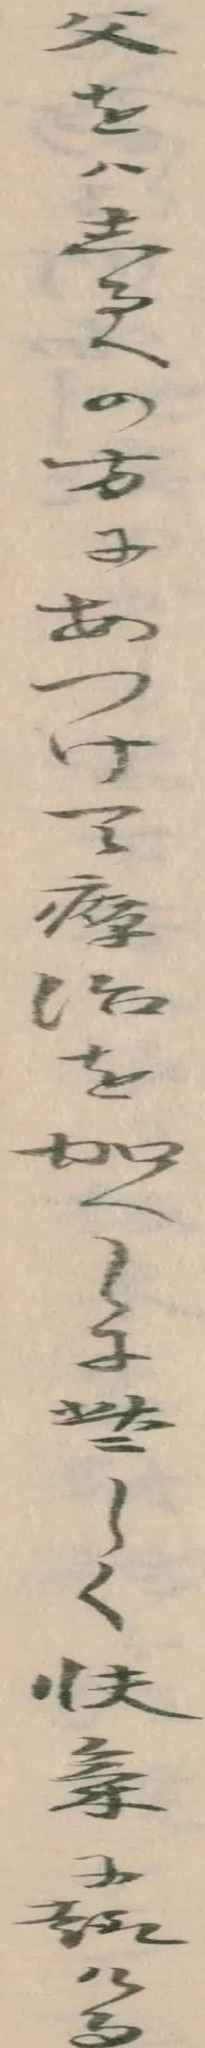父をはしるへの方にあつけて療治を加へしに些しく快気に趣ける
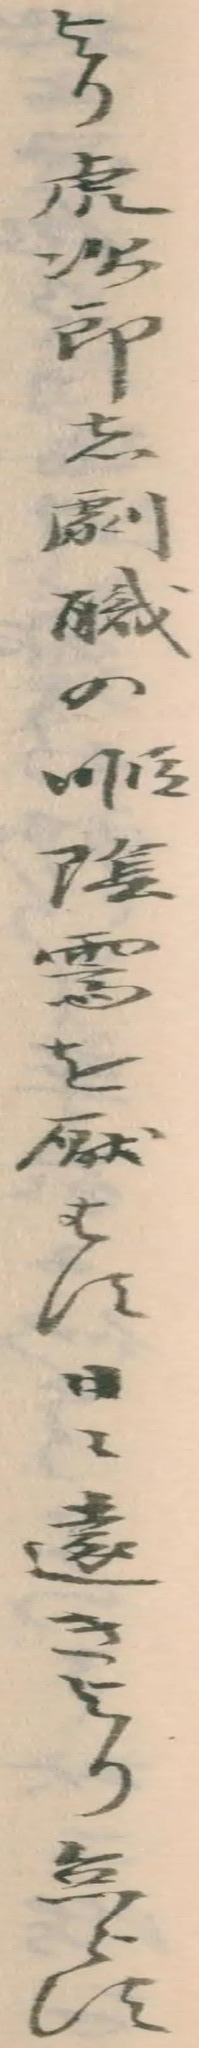より虎次郎は劇職の暇陰霽を厭はす日々遠きより怠らす
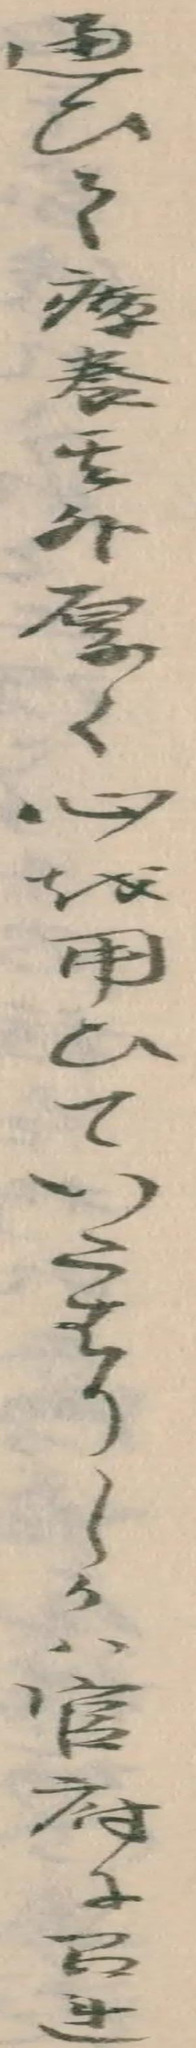通ひて療養其外厚く心を用ひていたはりしかは官府に召れ
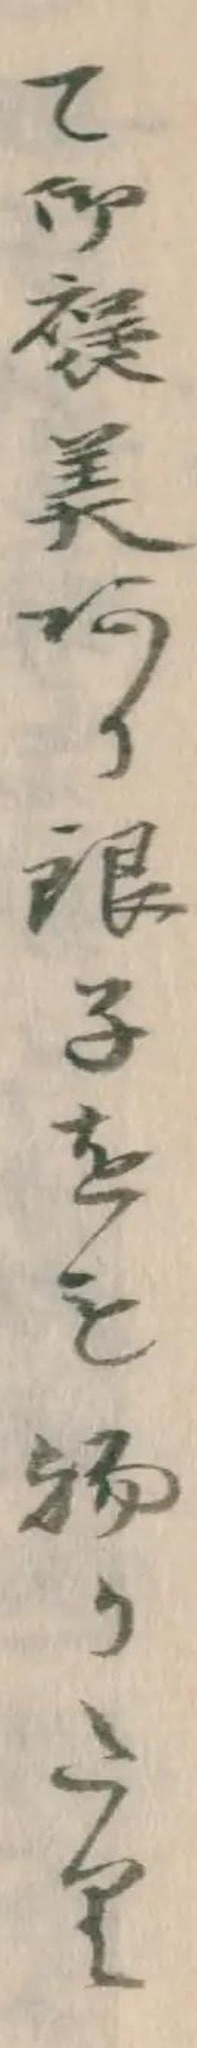て御褒美あり銀子をも賜りたり
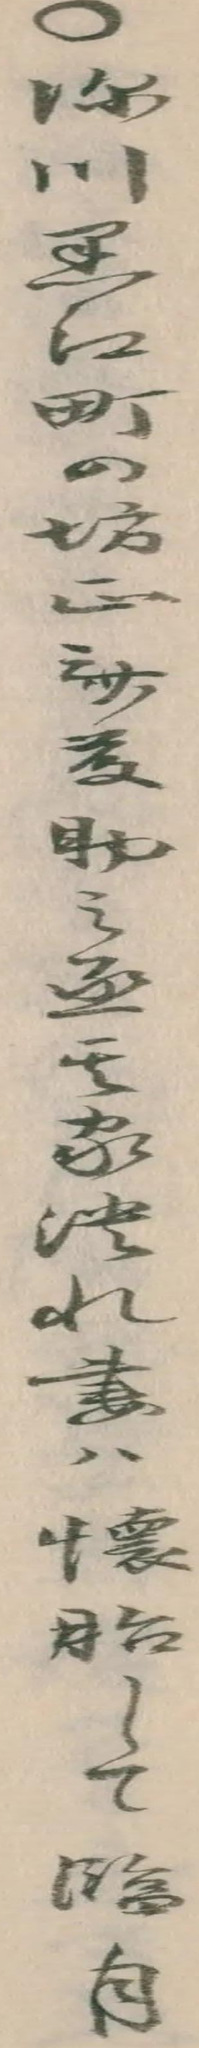〇深川黒江町の坊正齋藤助之丞其家潰れ妻は懐胎して臨月
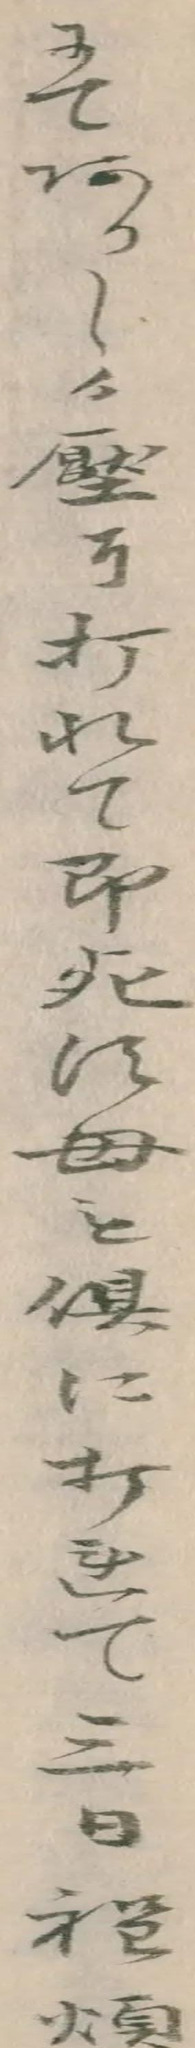にてありしか圧に打れて即死す母も倶に打れて三日程煩
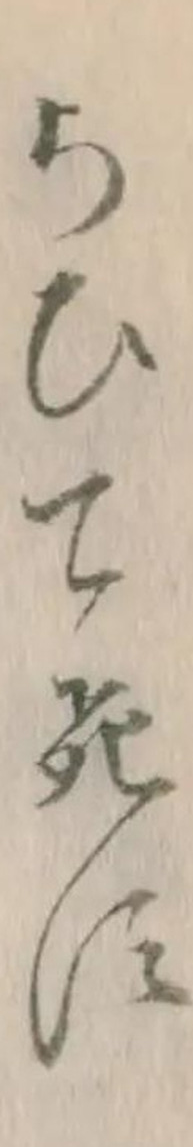らひて死す
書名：地災撮要. 巻7-9(地震之部)
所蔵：国立国会図書館 National Diet Library, JAPAN
